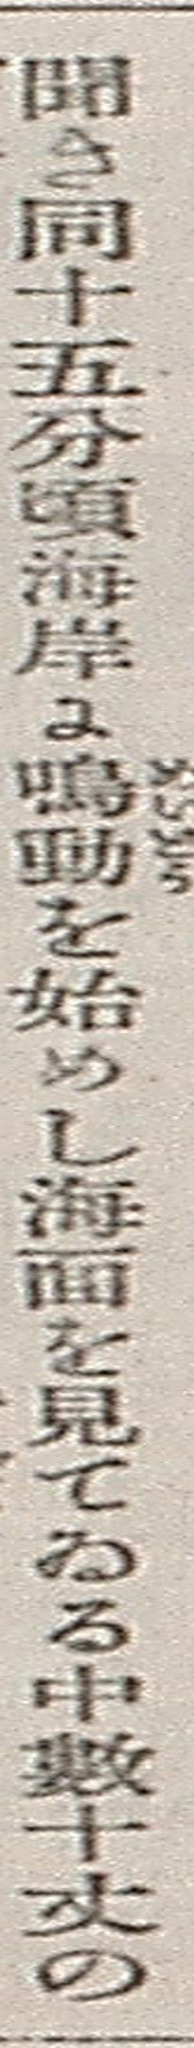聞き同十五分頃海岸に鳴動を始めし海面を見てゐる中数十丈の
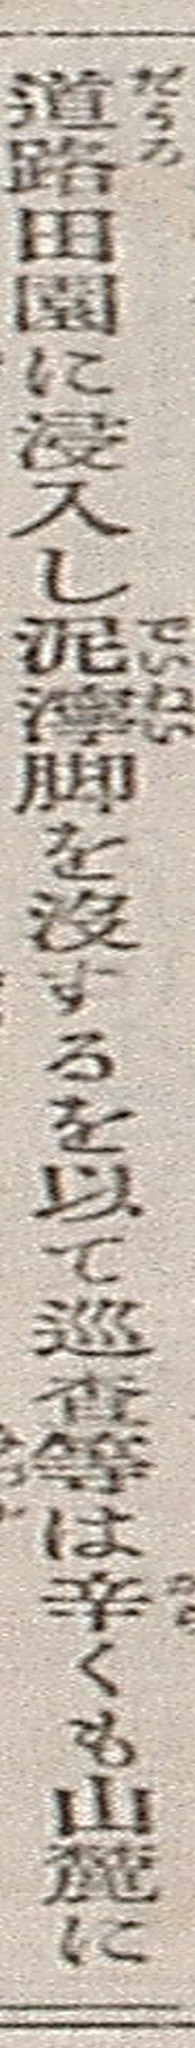道路田園に侵入し泥濘脚を没するを以て巡査等は辛くも山麓に
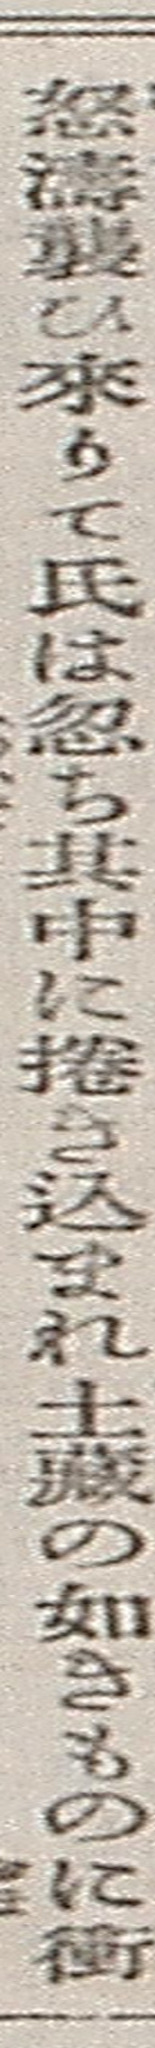怒涛襲ひ来りて氏は忽ち其中に捲き込まれ土蔵の如きものに衝
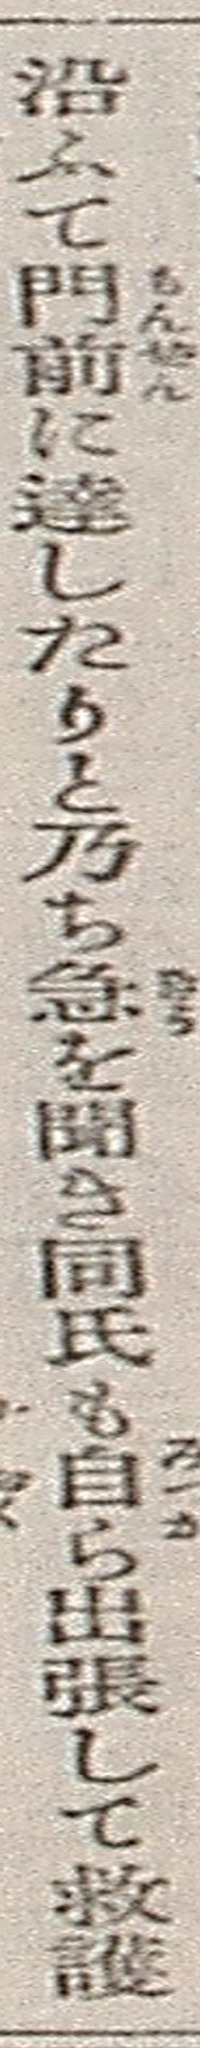沿ふて門前に達したりと乃ち急を聞き同氏も自ら出張して救護
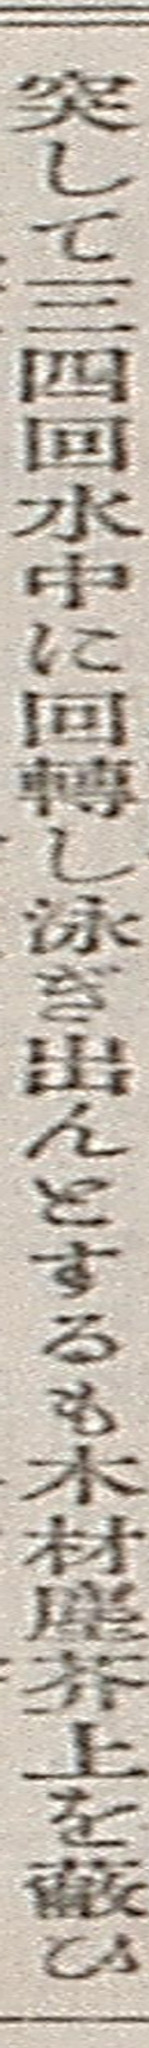突して三四回水中に回転し泳ぎ出んとするも木材塵芥上を蔽ひ
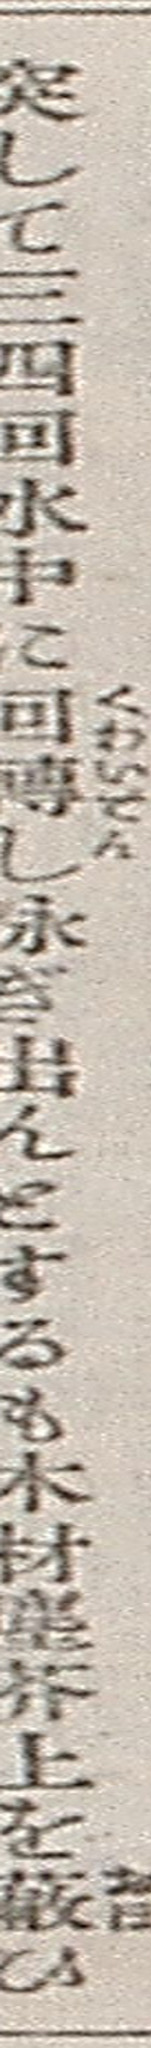突して三四回水中に回転し泳ぎ出んとするも木材塵芥上を蔽ひ
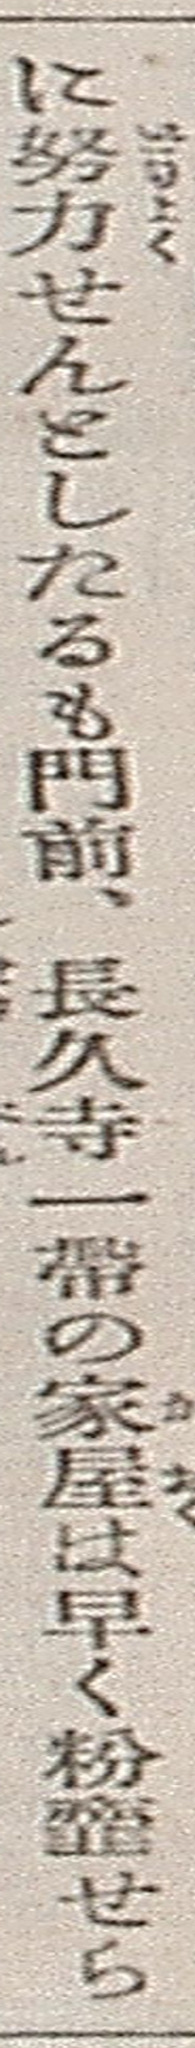に努力せんとしたるも門前、長久寺一帯の家屋は早く粉韲せら
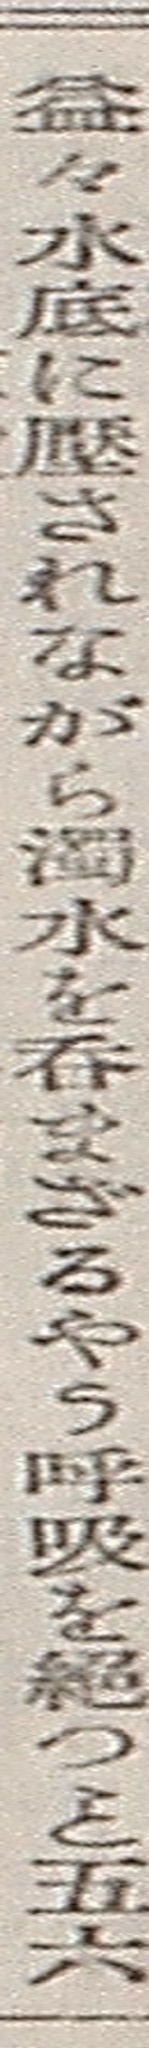益々水底に圧されながら濁水を呑まざるやう呼吸を絶つと五六
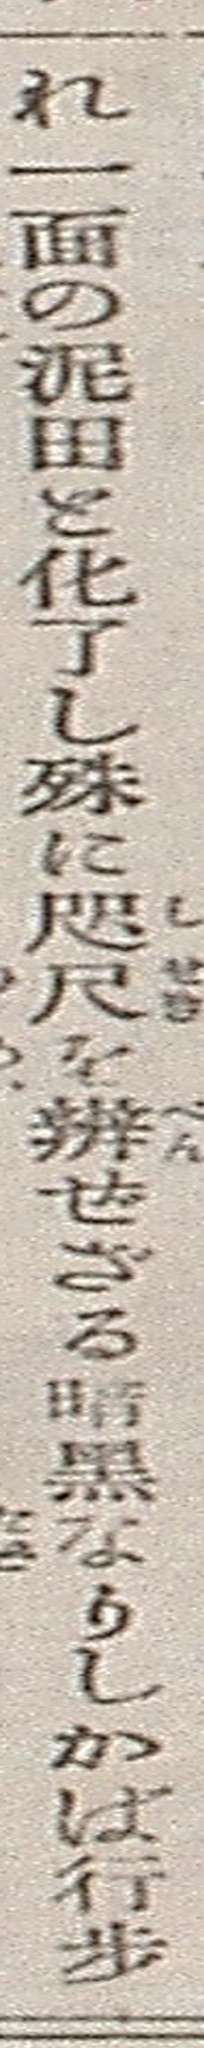れ一面の泥田と化了し殊に咫尺を辨ぜざる暗黒なりしかば行歩
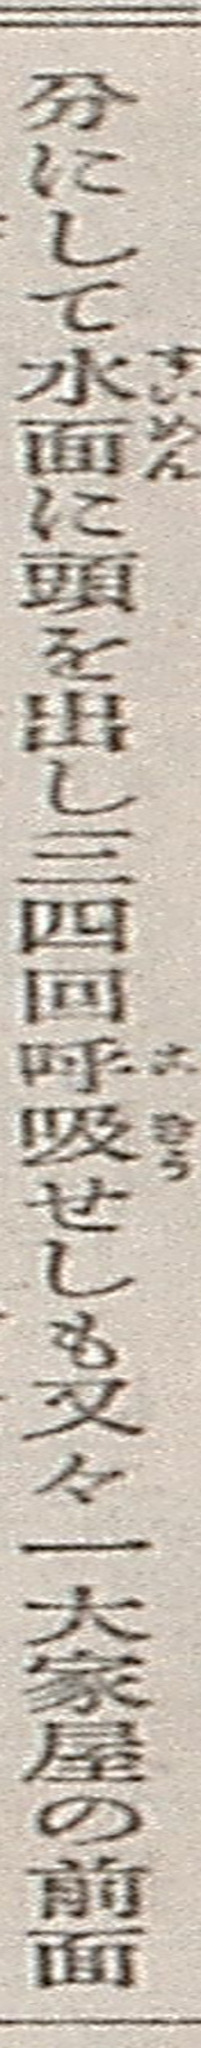分にして水面に頭を出し三四回呼吸せしも又々一大家屋の前面
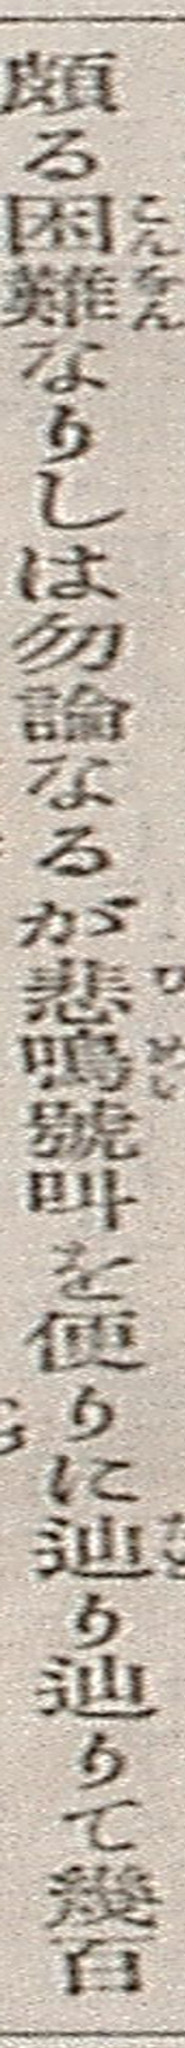頗る困難なりしは勿論なるが悲鳴号叫を便りに辿り辿りて幾百
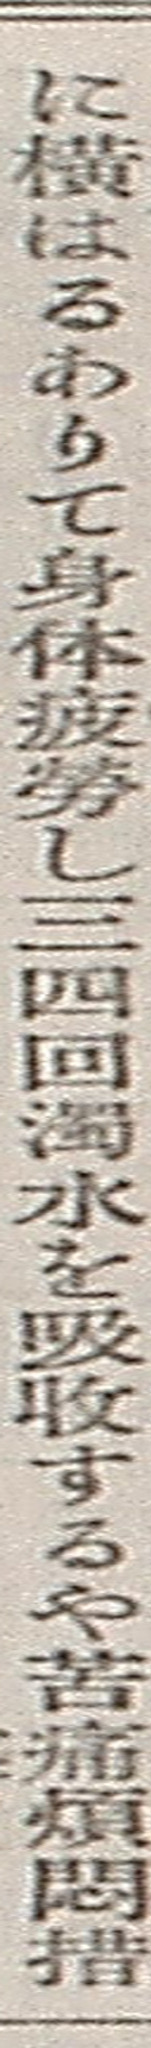に横はるありて身体疲労し三四回濁水を吸収するや苦痛煩悶措
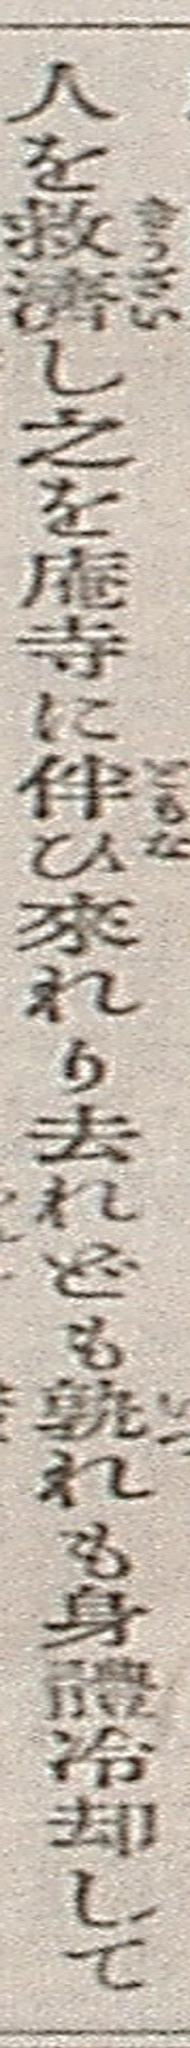人を救済し之を庵寺に伴ひ来れり去れども孰れも身体冷却して
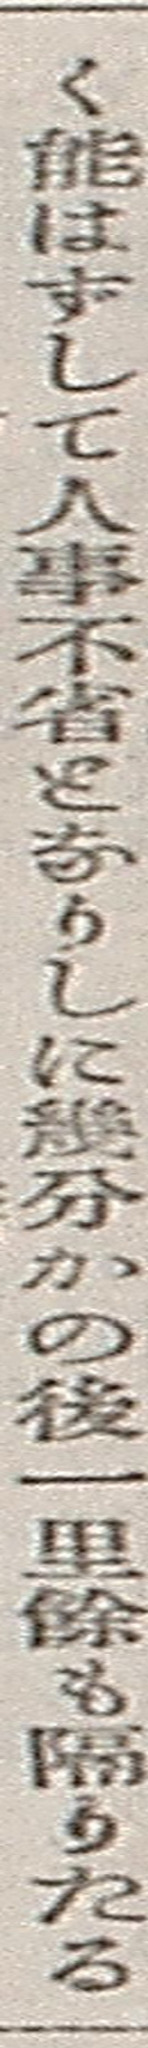く能はずして人事不省となりしに幾分かの後一里余も隔りたる
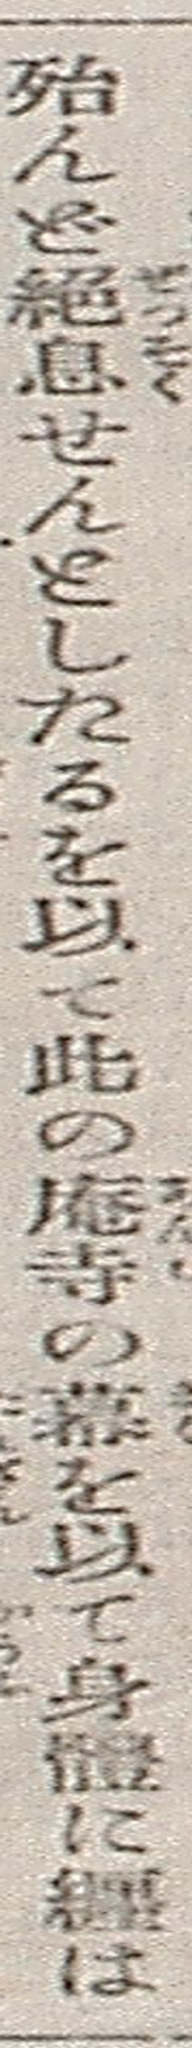殆んど絶息せんとしたるを以て此の庵寺の幕を以て身体に纏は
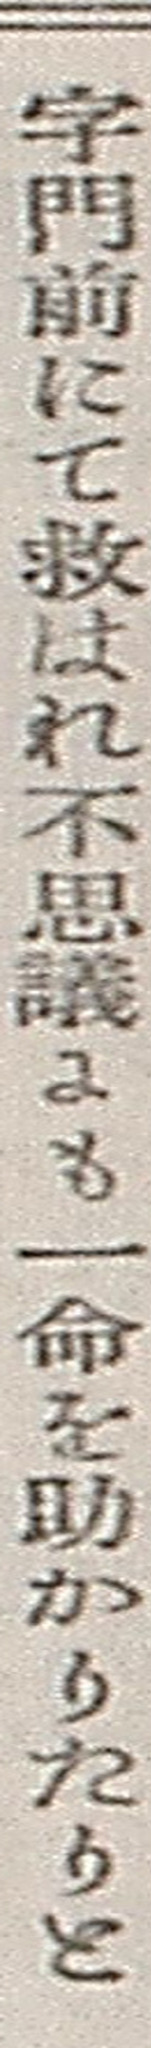字門前にて救はれ不思議にも一命を助かりたりと
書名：風俗畫報臨時増刊第百十九號　大海嘯被害録（中）
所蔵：東京大学地震研究所図書室 Earthquake Research Institute Library, The University of Tokyo, JAPAN
